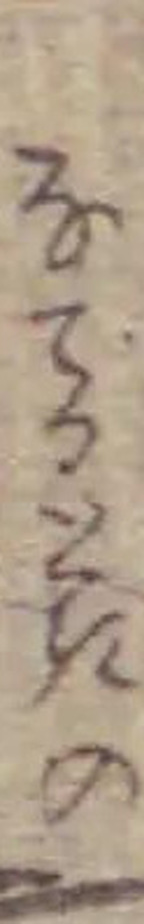なでるときの

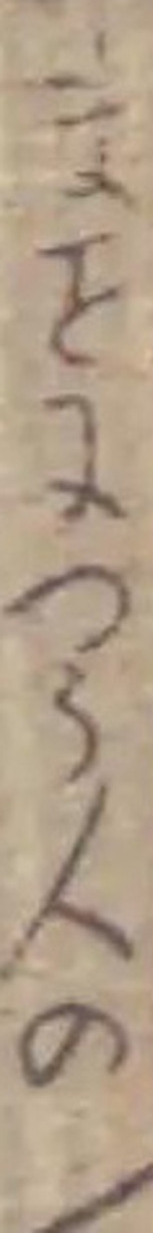まことにつう人の
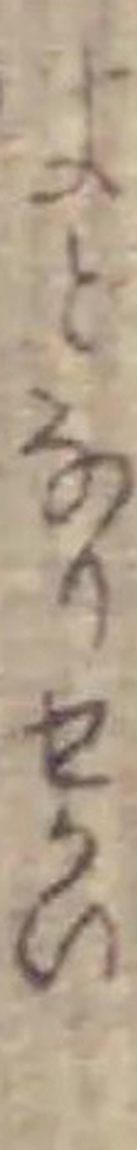よとなりせかい
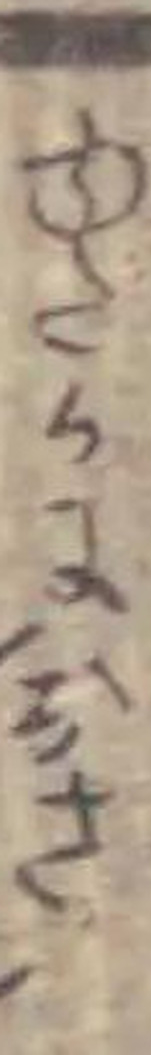ゆたかにおさ
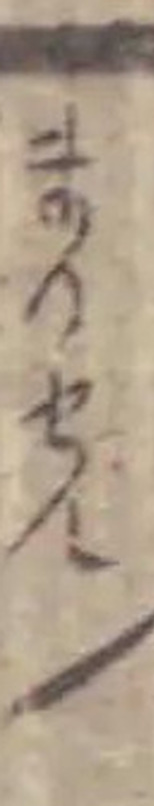まりせん
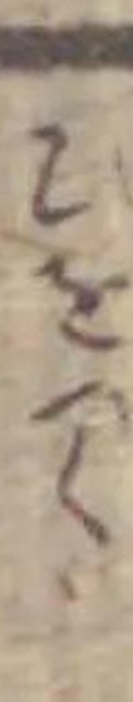ひをつく
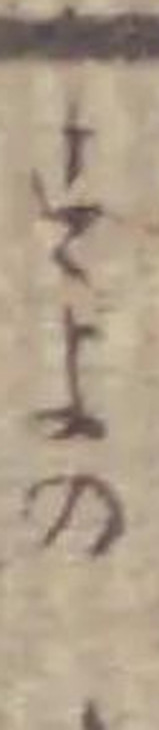すよの
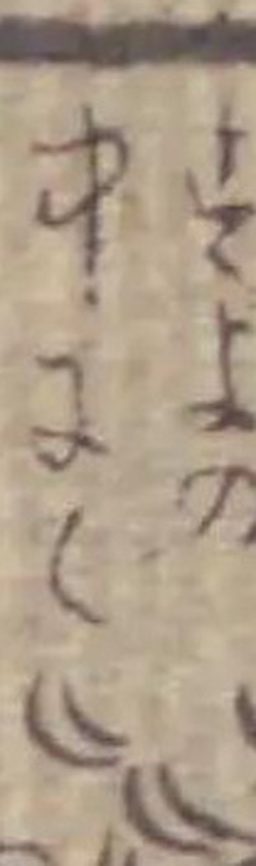中にて
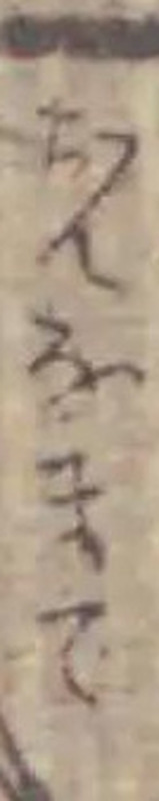おんなまで
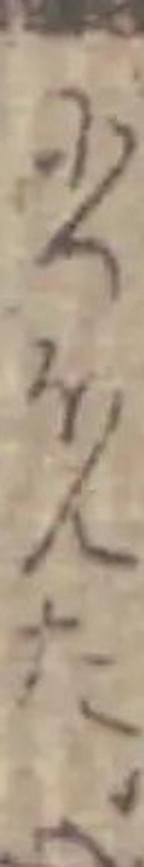につほんた
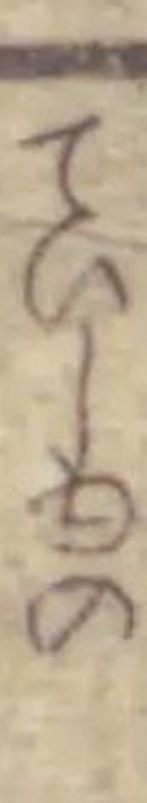ていしゆの
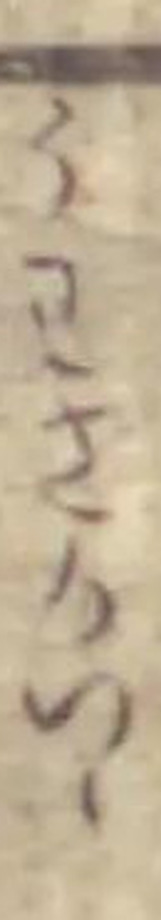うわさかいゝ
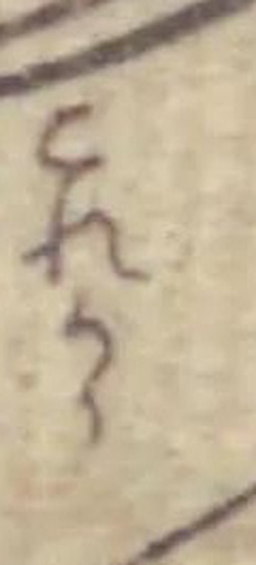これから
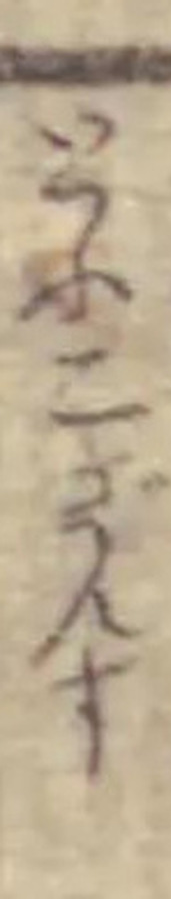とふござんす
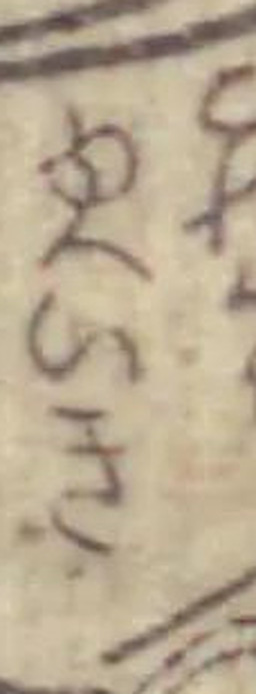ゆへいき
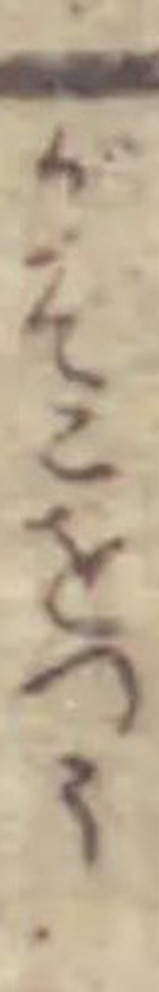がそこをつう
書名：茶羅毛通人 3巻
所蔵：国立国会図書館 National Diet Library, JAPAN
